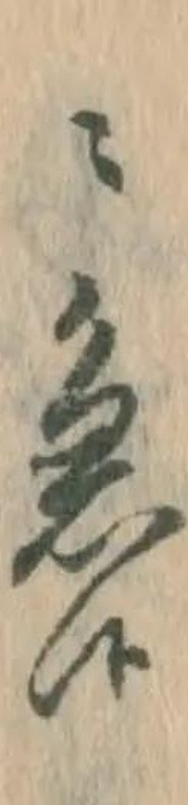に急候
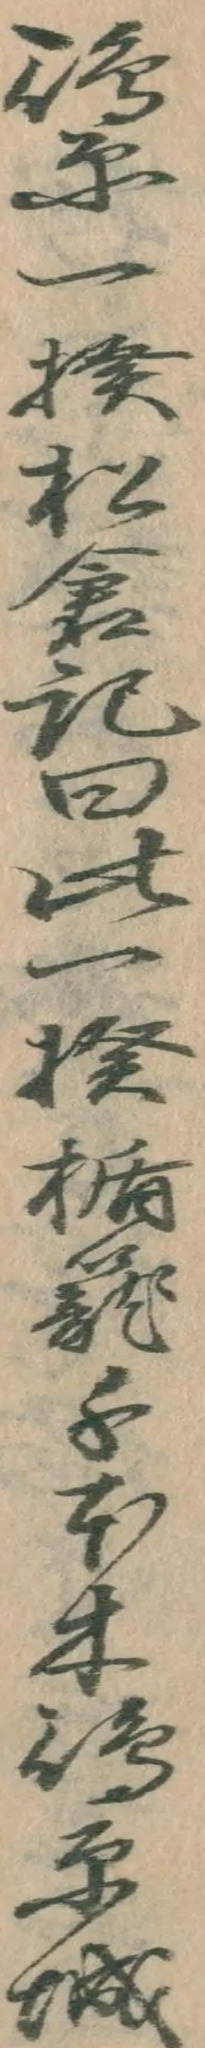島原一揆松倉記曰此一揆楯籠千本木島原城
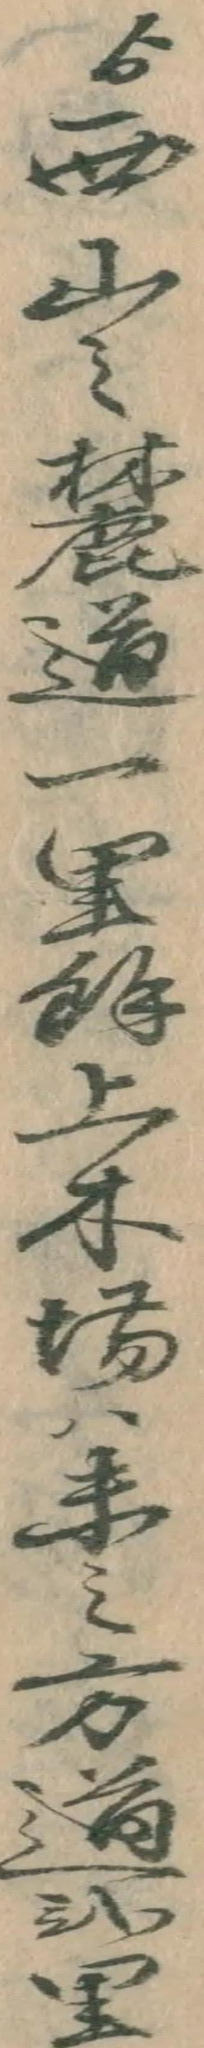ゟ西山之麓道一里余上木場は未之道弐里
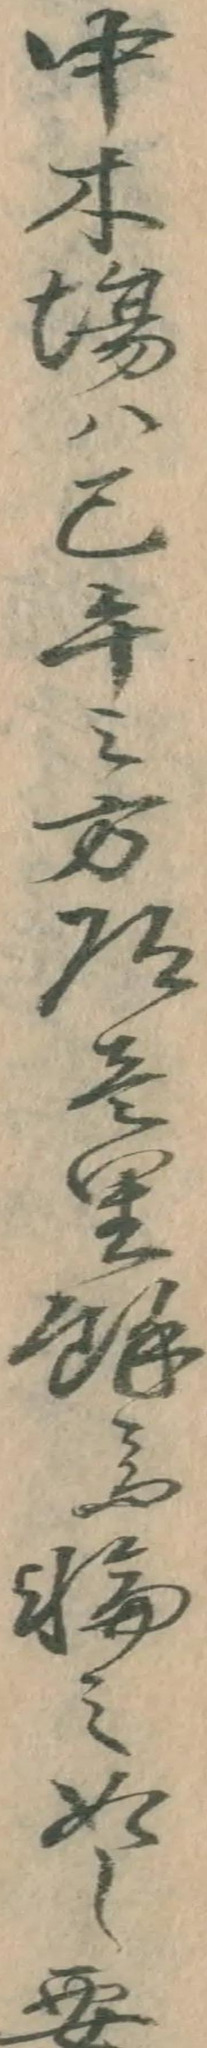中木場は巳午之方道壱里余に而輪之如し要

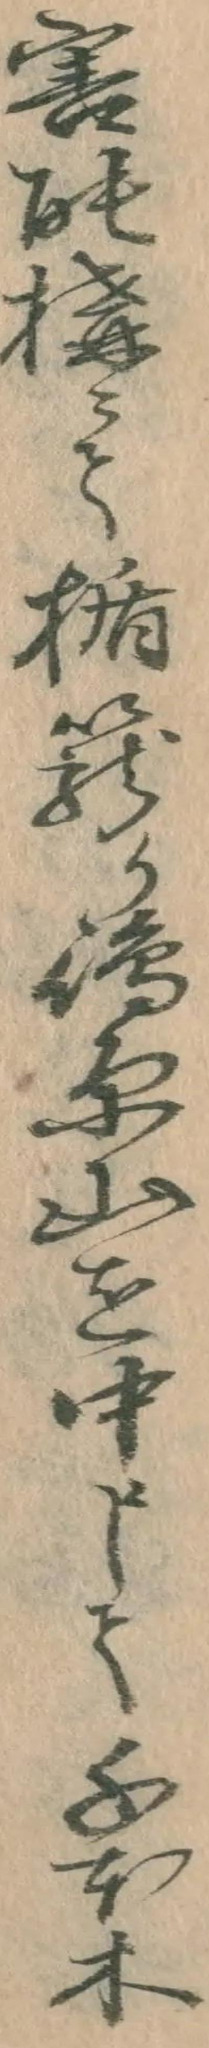害能構にて楯籠り島原山を中として千本木
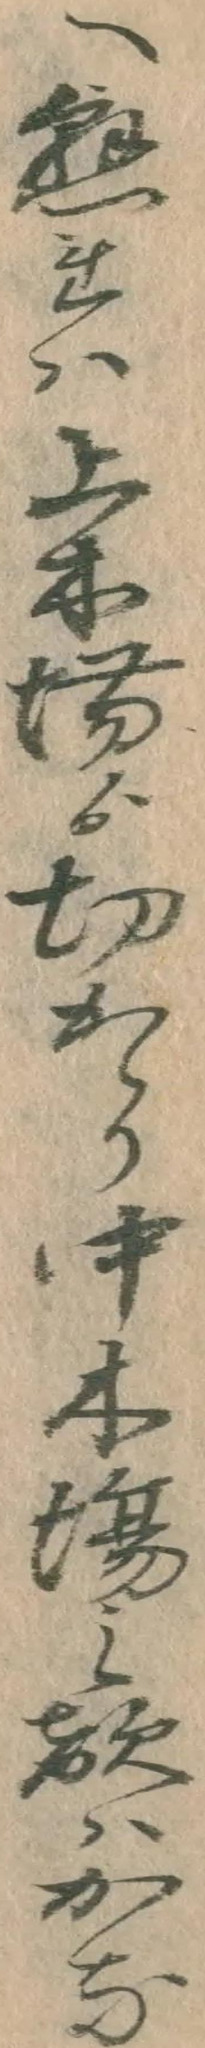へ懸連は上木場ゟ切かゝり中木場之敵はかな
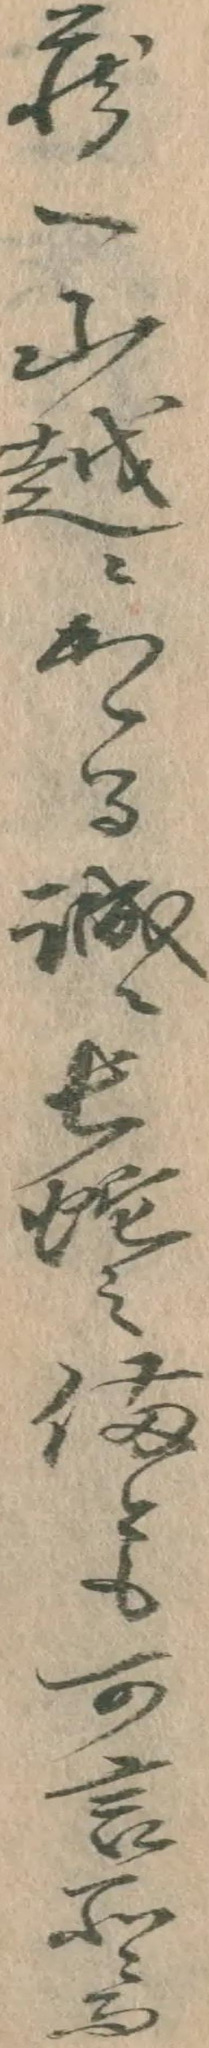蔵へ山越にかゝる誠に長蛇之備とも可言所に而
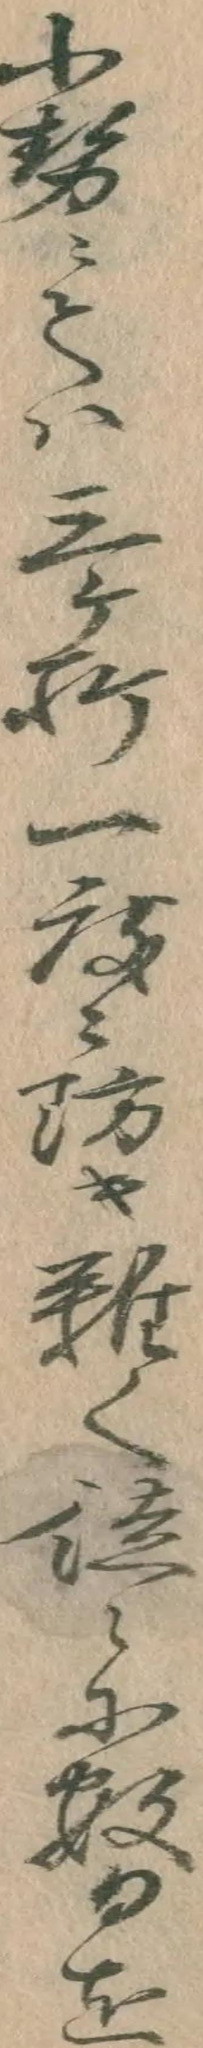小勢にては三け所一度に防き難く徒々尓数日を
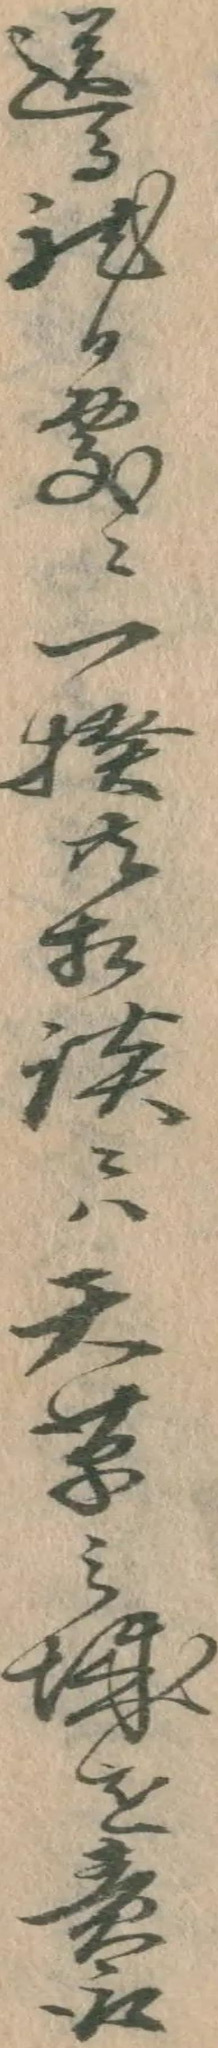送る然る處に一揆共相談には天草之城を責取
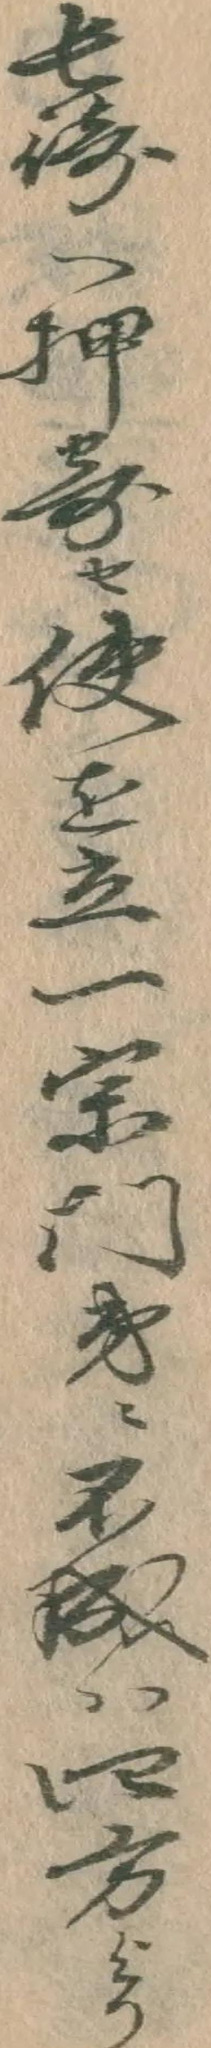長崎へ押寄せ使を立一宗門弟に不成は四方与り
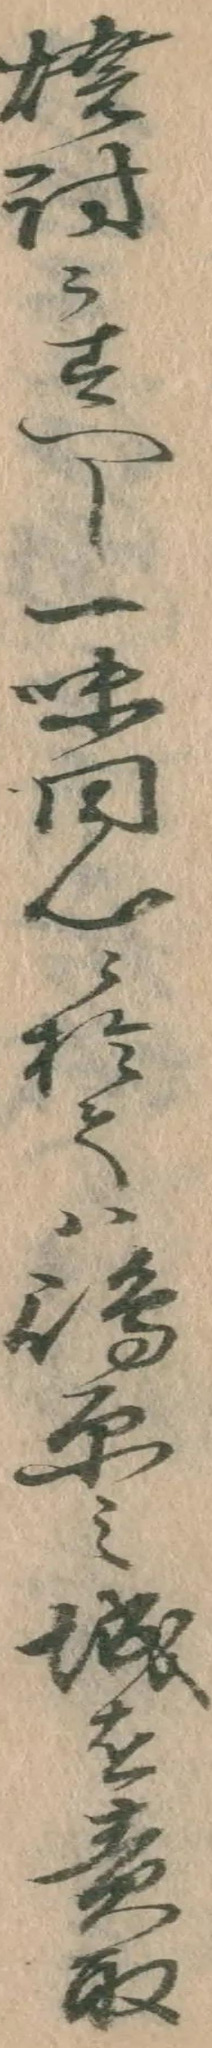焼討に春へし一味同心に於ては島原之城を責取
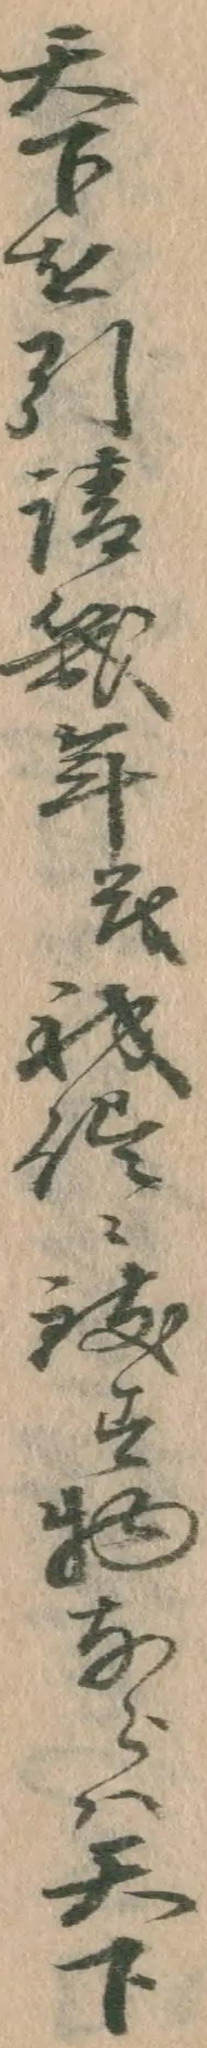天下を引請幾年茂我侭に致す物ならは天下
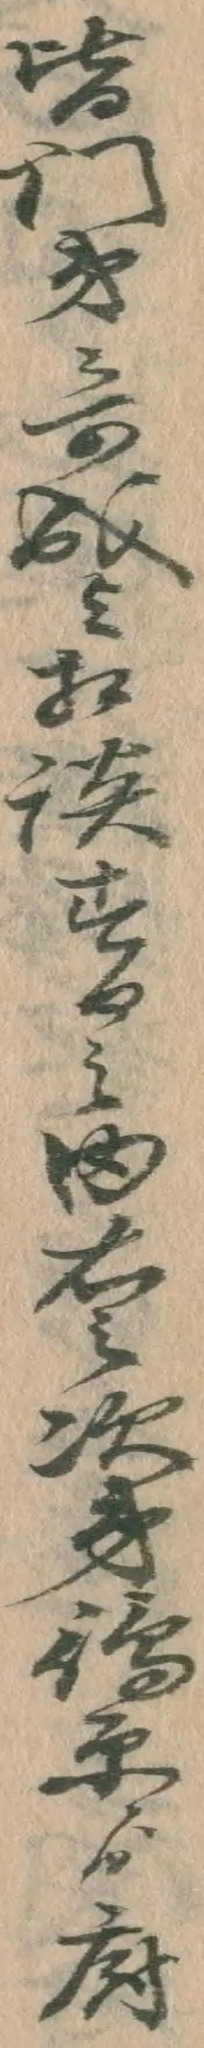皆門弟に可成と相談春る之由右之次第島原ゟ府
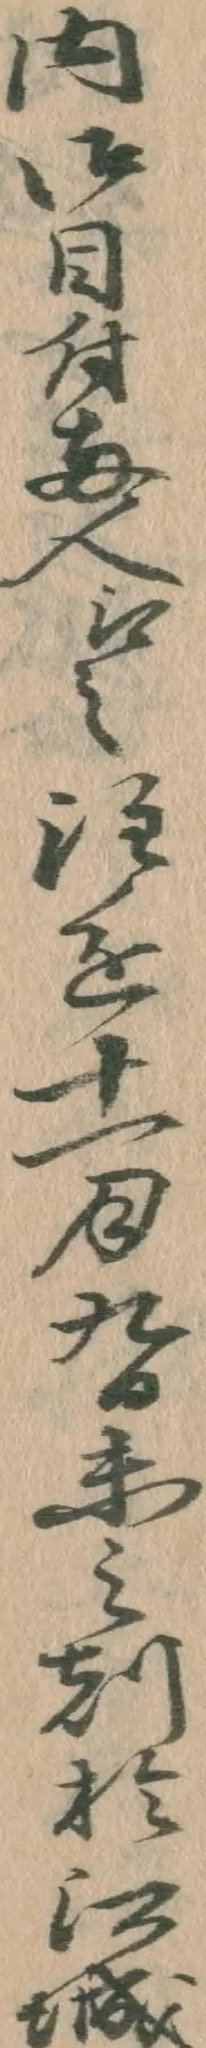内御目付両人江之注進十一月九日未之刻於江城
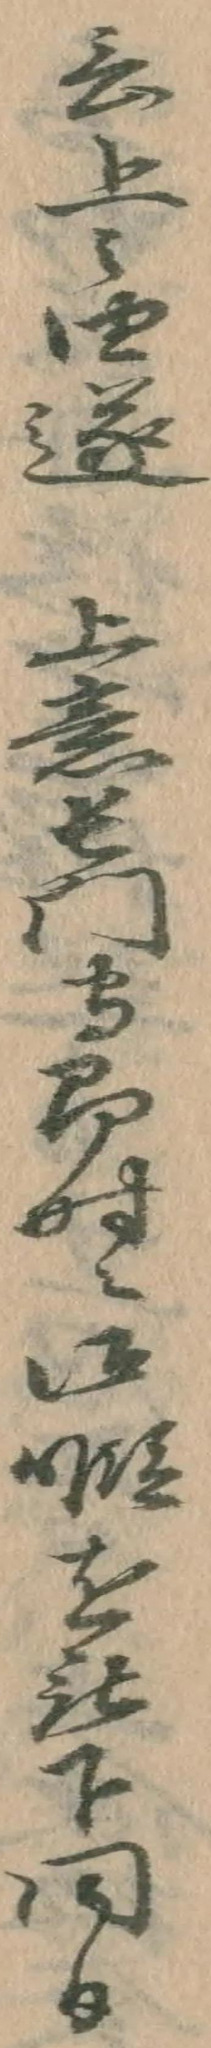云上之由遂上意長門守即時に御暇を被下同日
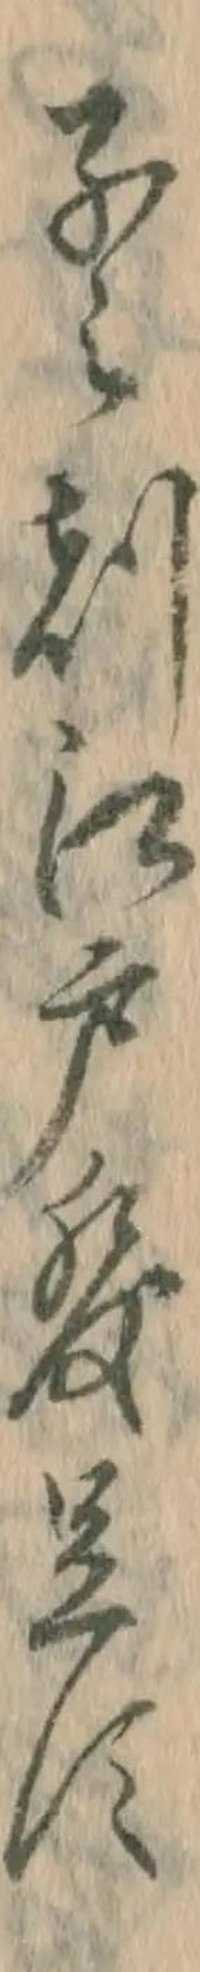子之刻江戸発足須
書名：切支丹御退治記 49巻. [2]
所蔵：国立国会図書館 National Diet Library, JAPAN
